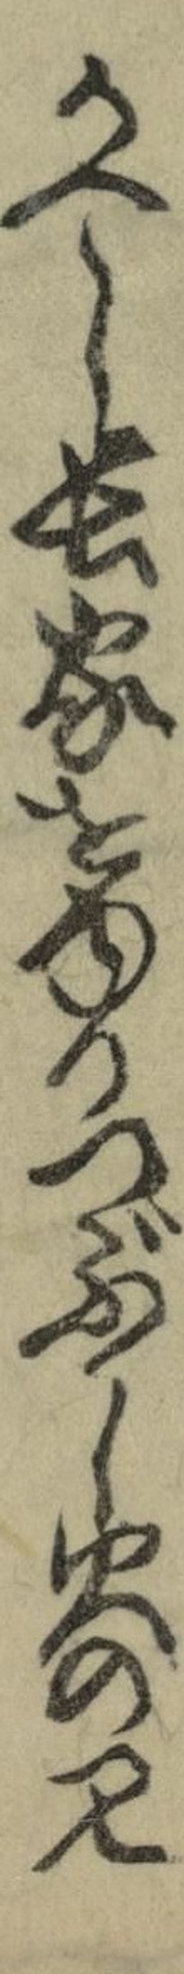かへし長家をゆりつぶし火の見
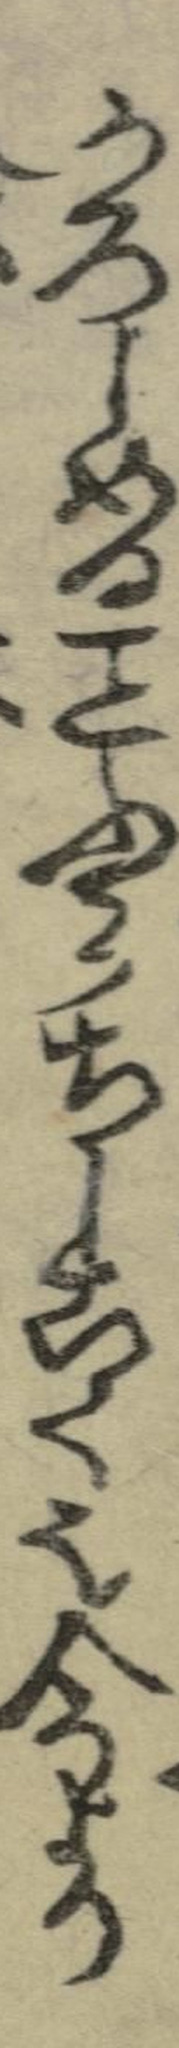かろしめることふらちしこく也今より
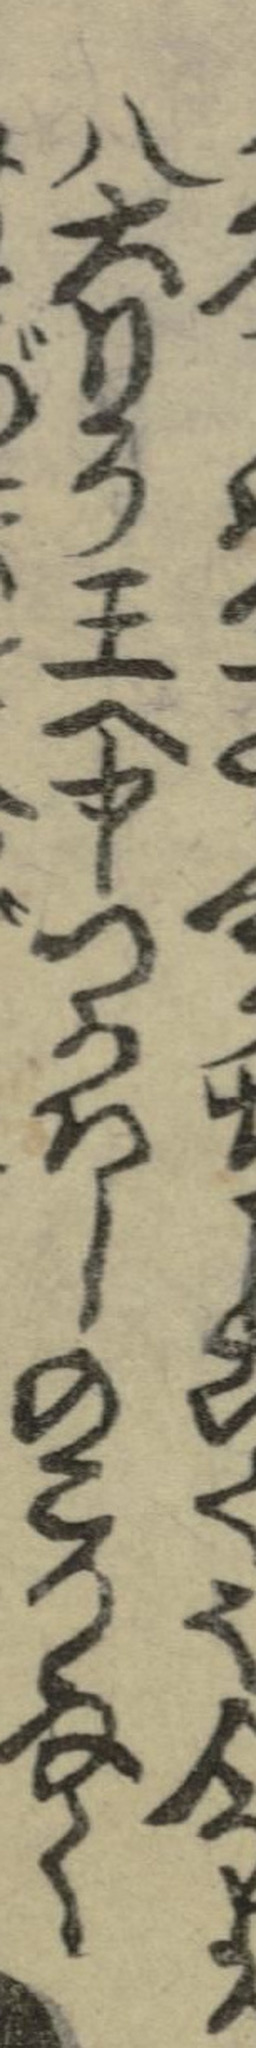八大りう王へ申つかはしのこりなく
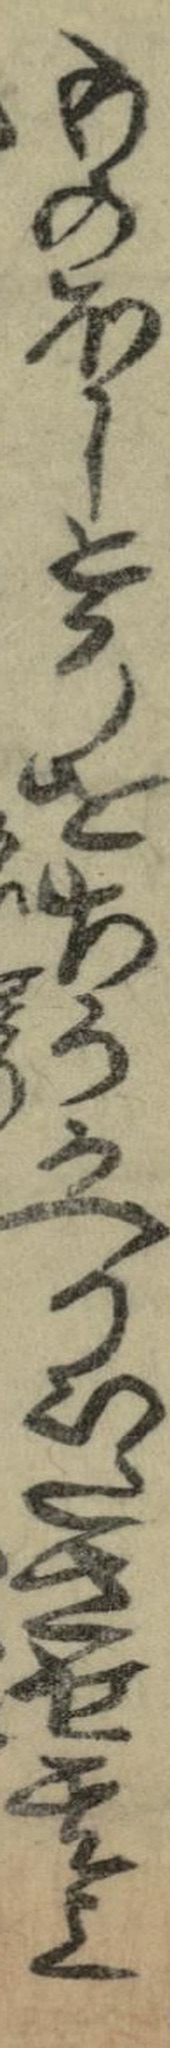ものほしとうをちうかへりいたさせ其上
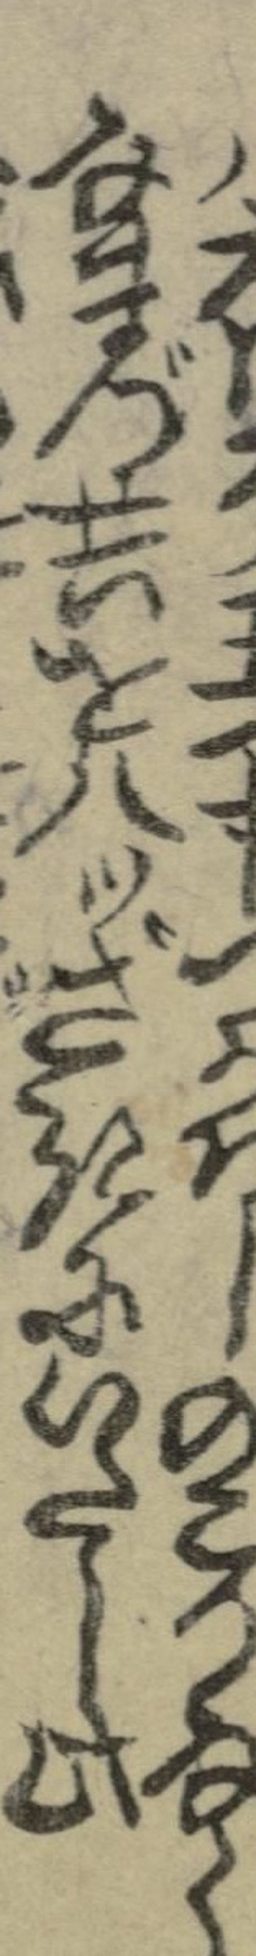なまづ共を八ツざきにいたし此
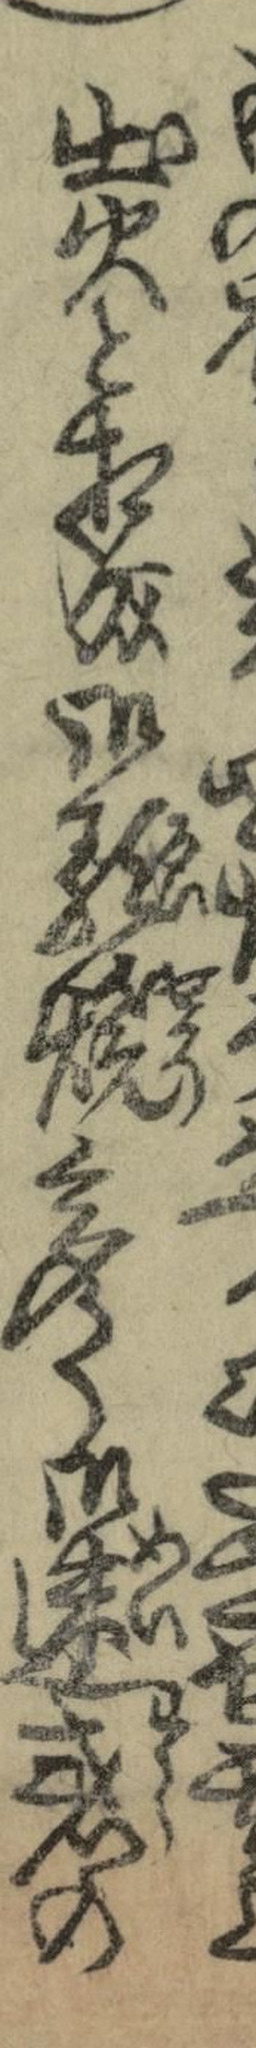出火と相成御類焼多く御迷惑の
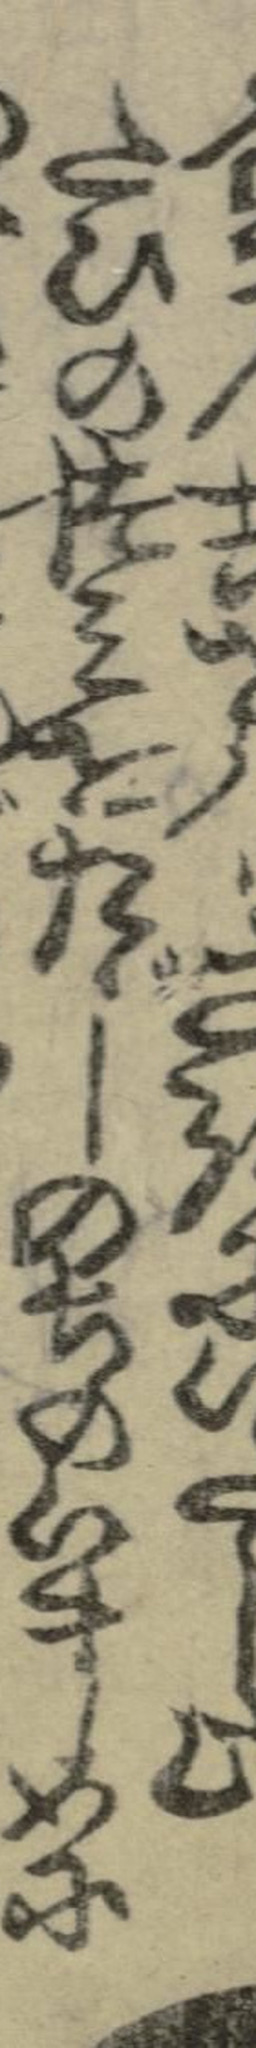たひのつみをたゞしのちのいましめに
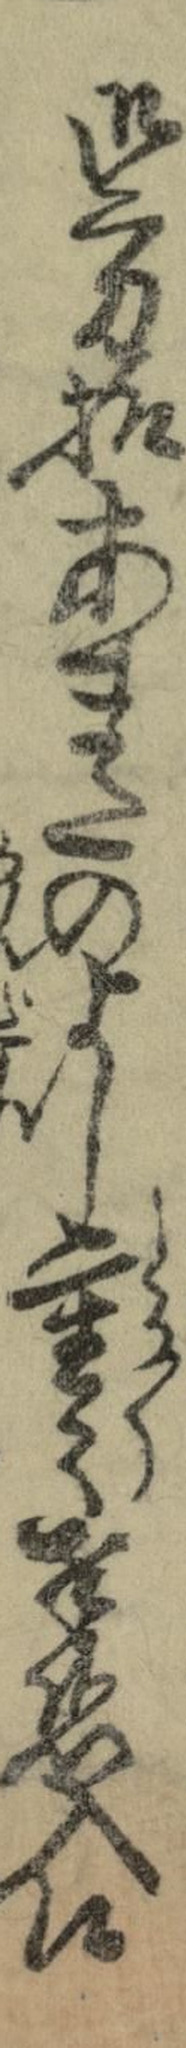御方様あまたのよし重々奉恐入候
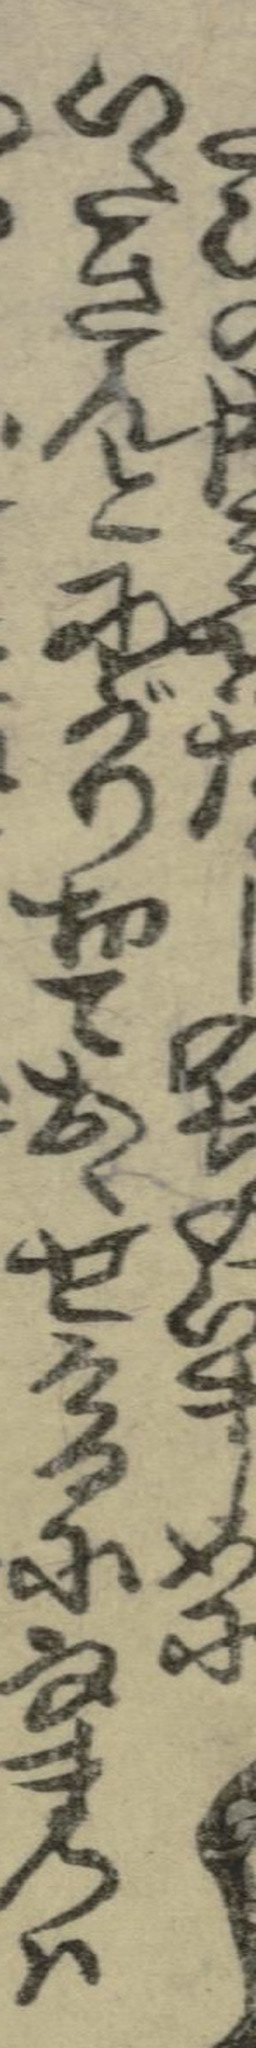いたさんとにがり切ておゝせけるになまつは
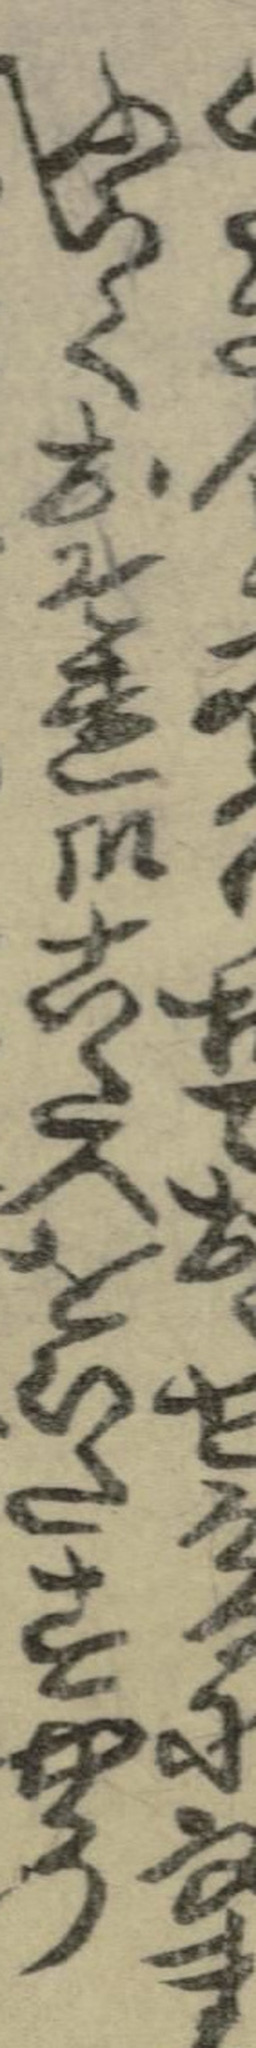ふかくおそれ御こたへをいたすやう
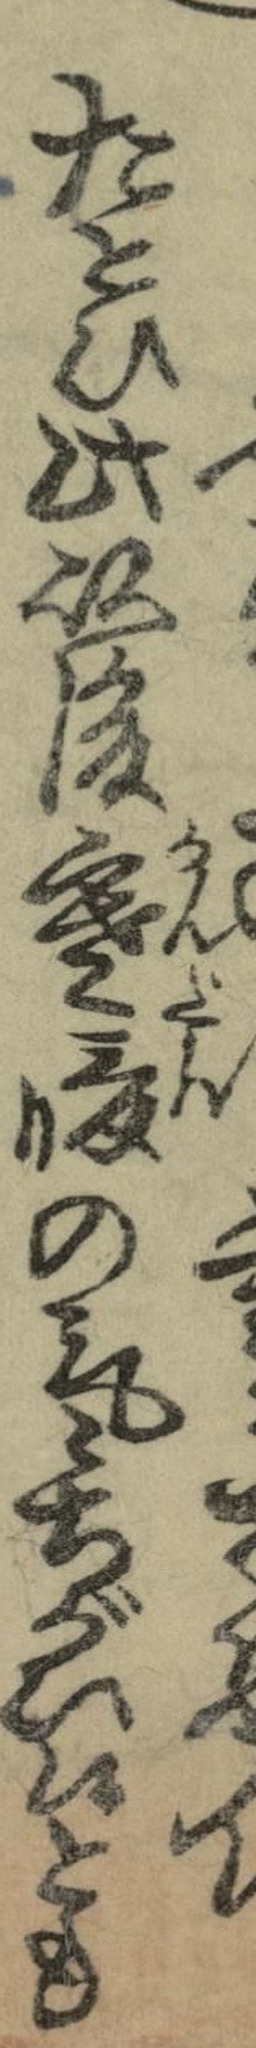たとひ此以後寒暖の気ちがい候とも
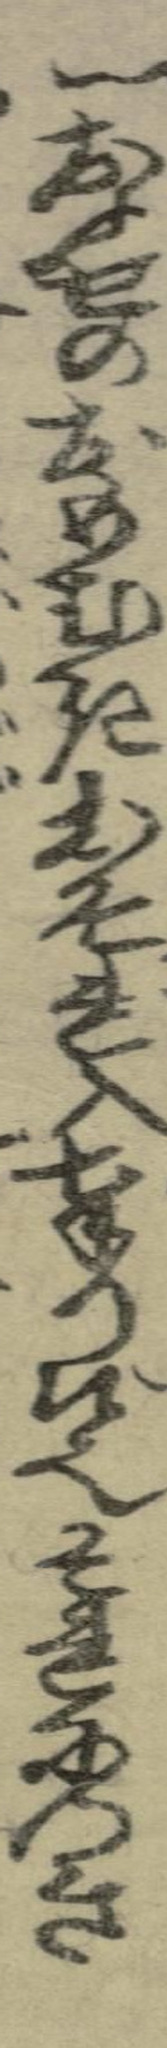〽おゝせのおもむきおそれ入奉り候也それにつき
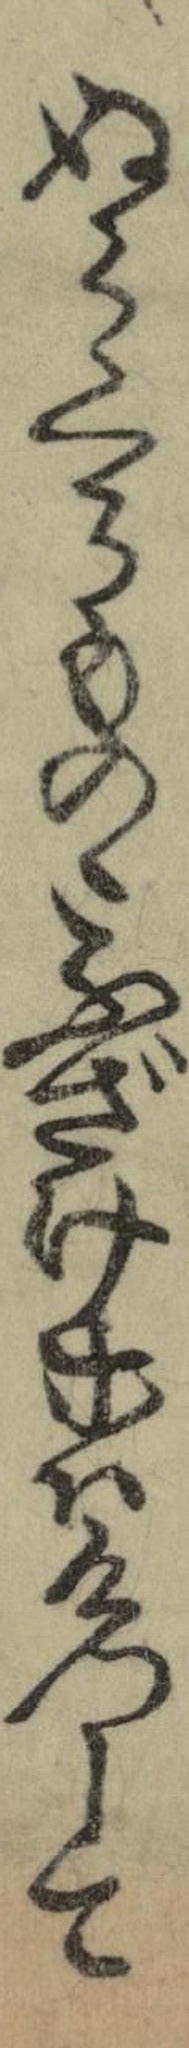ぬらくらものゝふざけ等はけつして
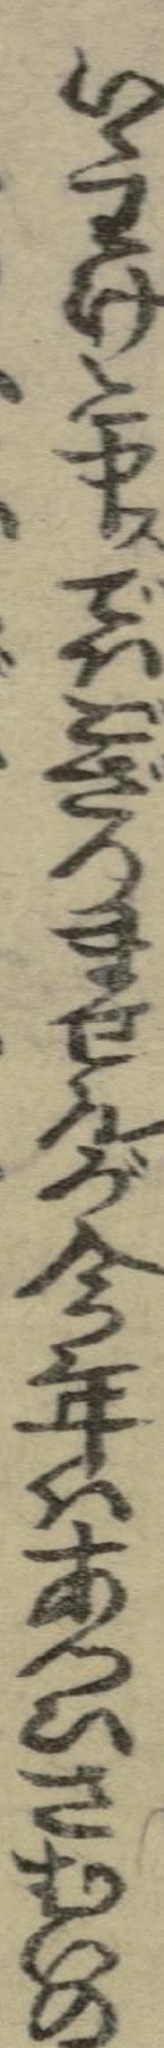いゝわけと申スではござりませんが今年はあついさむいの
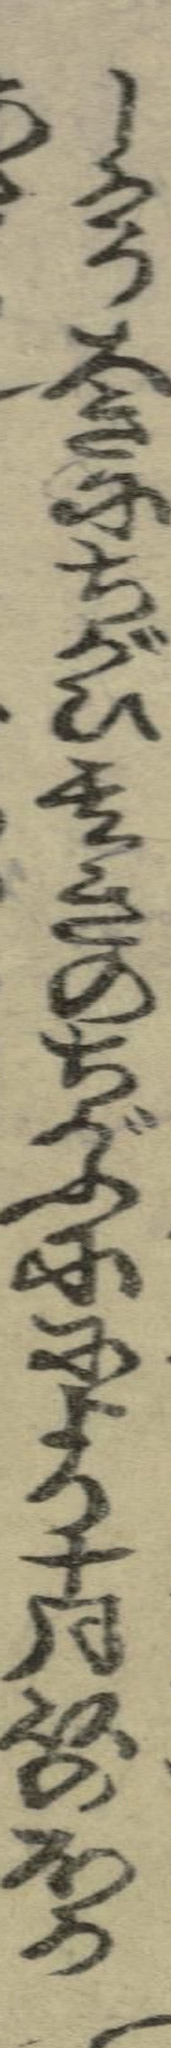しかゝり大きにちがひ其きのちがふにより十月以のほか
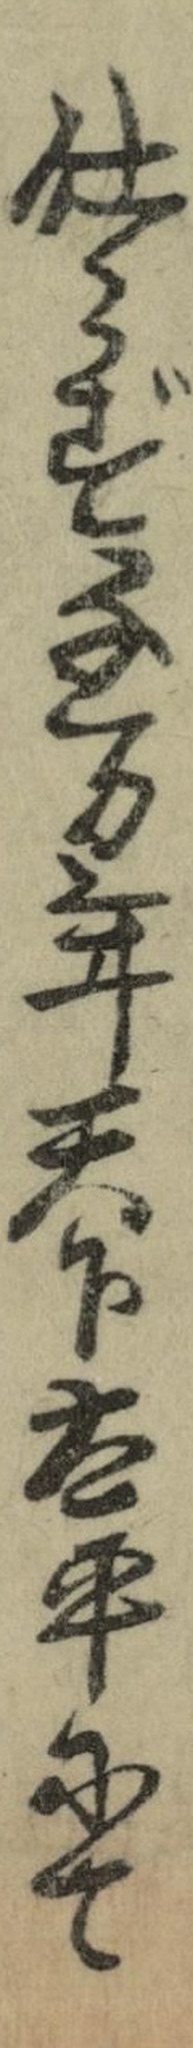仕らず千万年天下太平にて
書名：鹿島大神宮託曰
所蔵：東京大学地震研究所図書室 Earthquake Research Institute Library, The University of Tokyo, JAPAN
